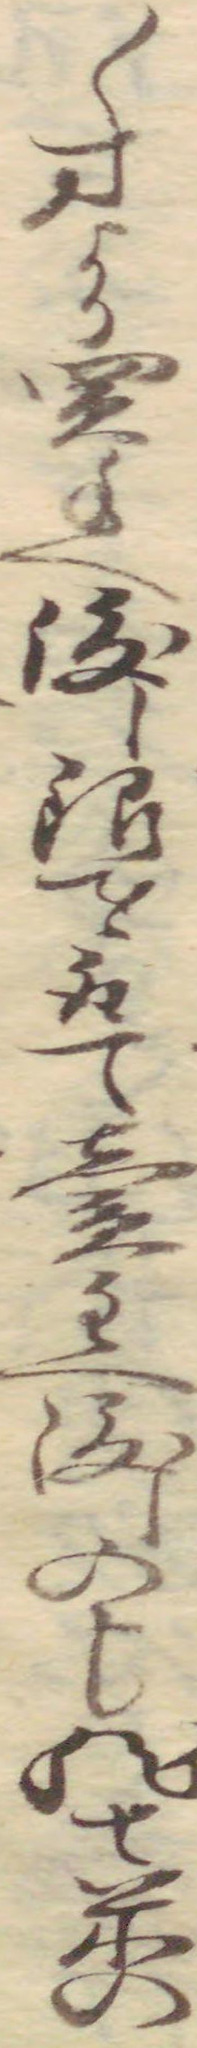〳〵方より買手へ渡し銀を取て売主へ渡し可申候然は米の
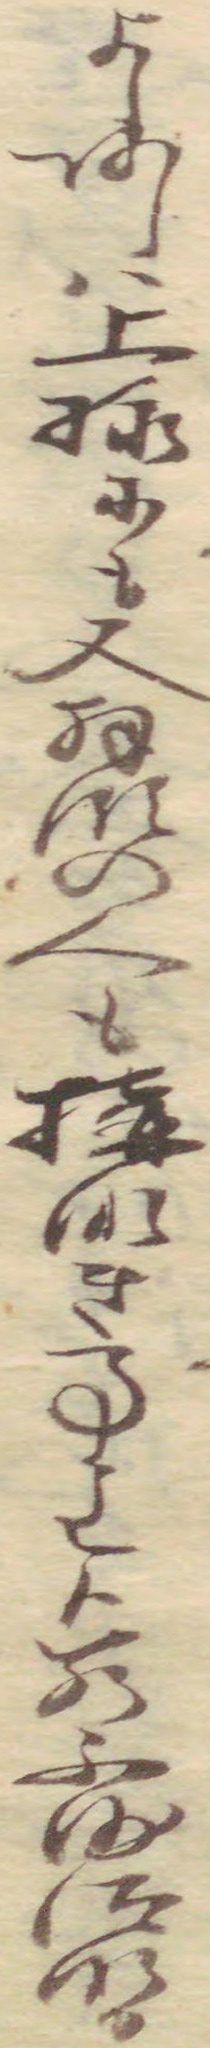よしあしは上様にも又拝領の人も構なき事ニて候若不沙汰なる
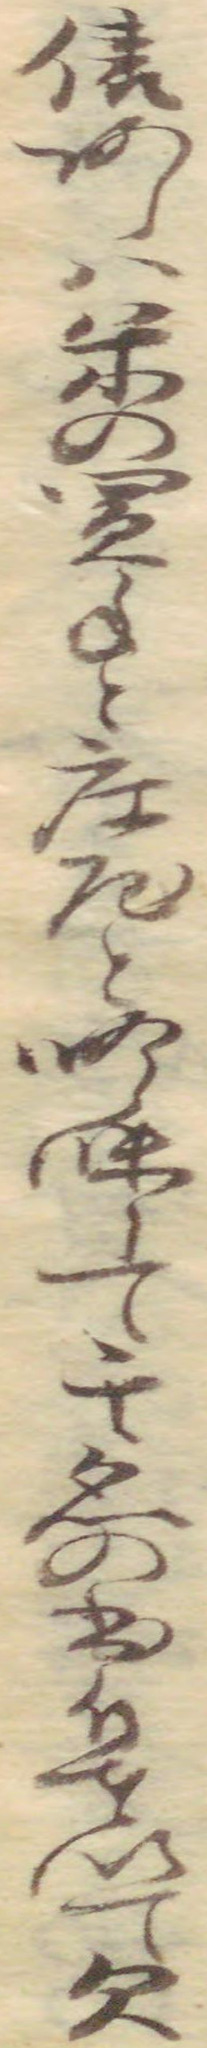俵あらは米の買手と庄屋と吟味して其名の書付を以て欠

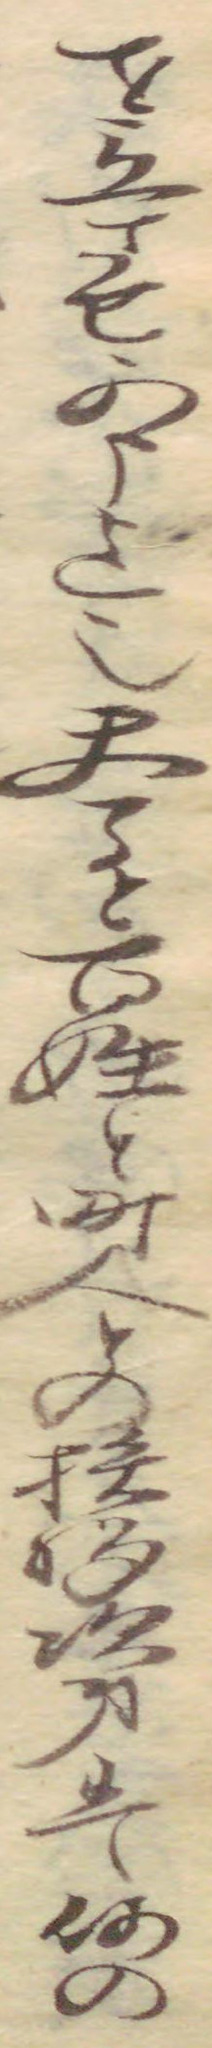を立させ可申迄也夫こそ百姓と町人との挨拶次第にて何の
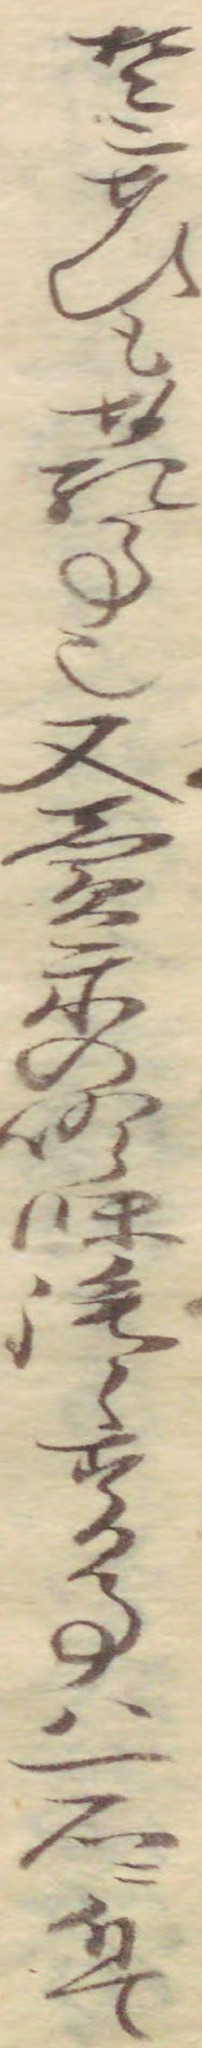そこなひもなき事也又売米の吟味強くする事は一石ニ付て
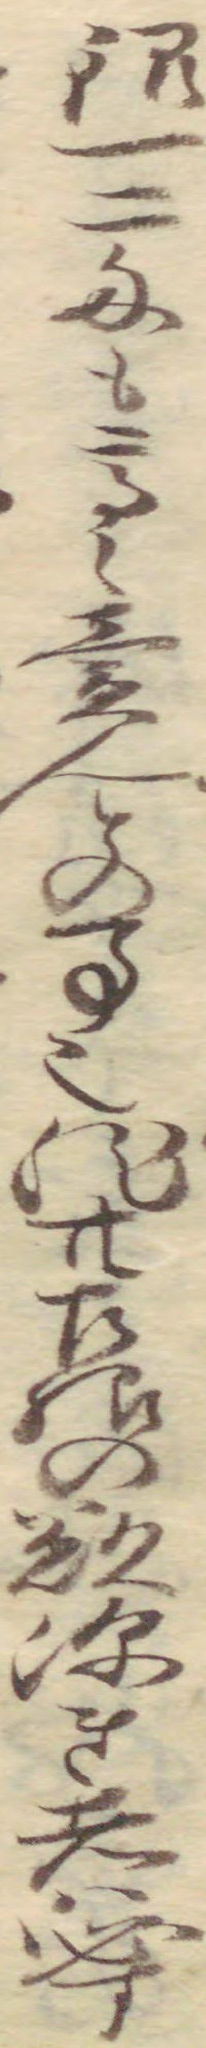銀一二匁も高く売人との事也然共左様の欲深き者は必す
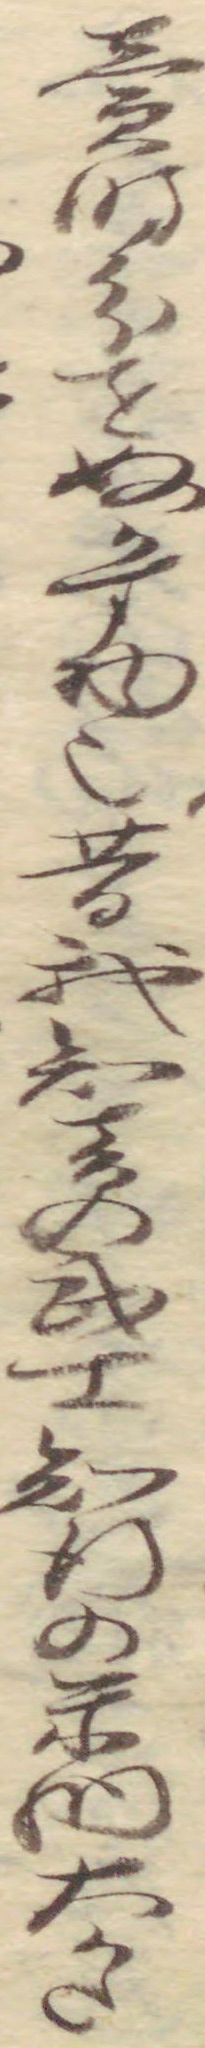売時分をぬかす物也昔我知音の武士知行の米納大かた
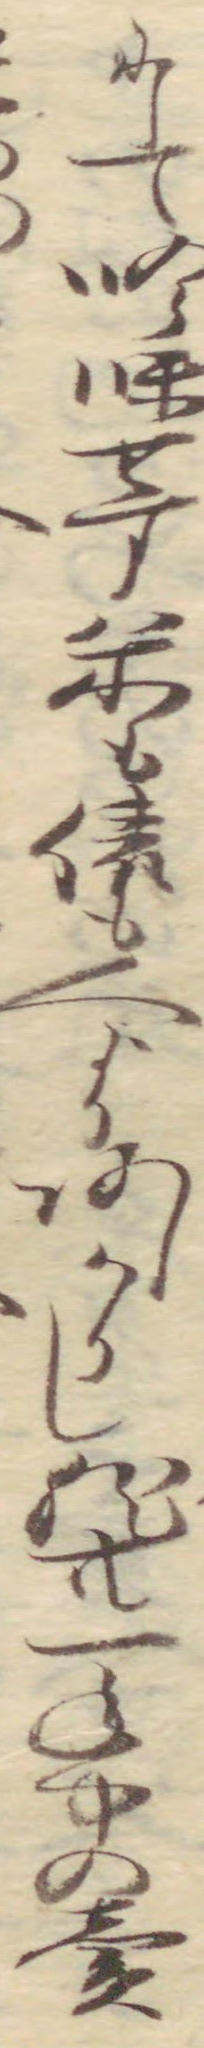にして吟味せす米も俵も人よりあしかりし然共一年中の売
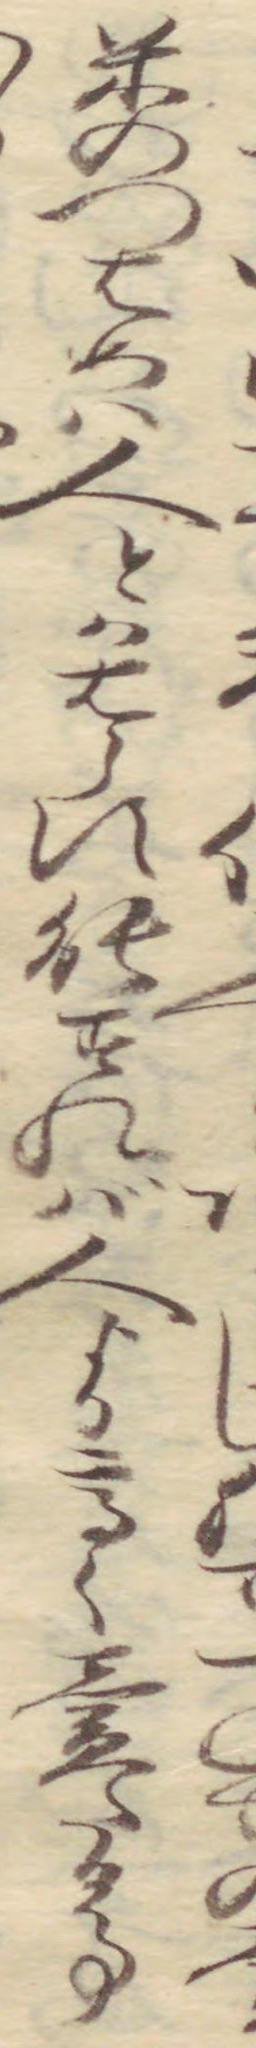米のつはめは人とかはらす能すれば人より高く売たる事
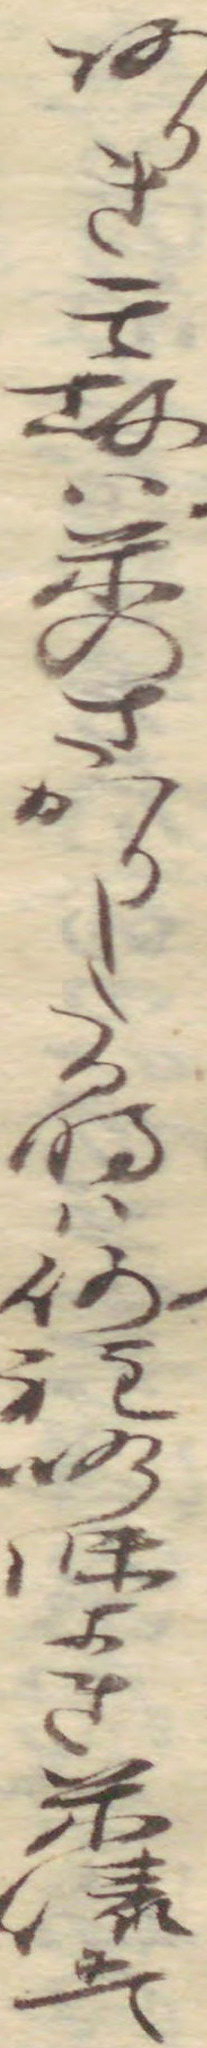ありき其故は米のさかりしたる時は何程吟味よき米俵にて
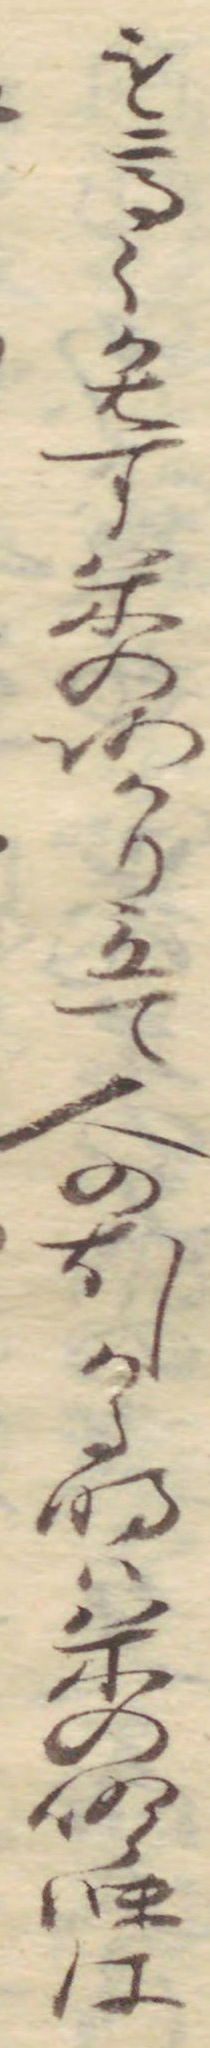も高くかはす米のあかり立て人のほしかる時は米の吟味は
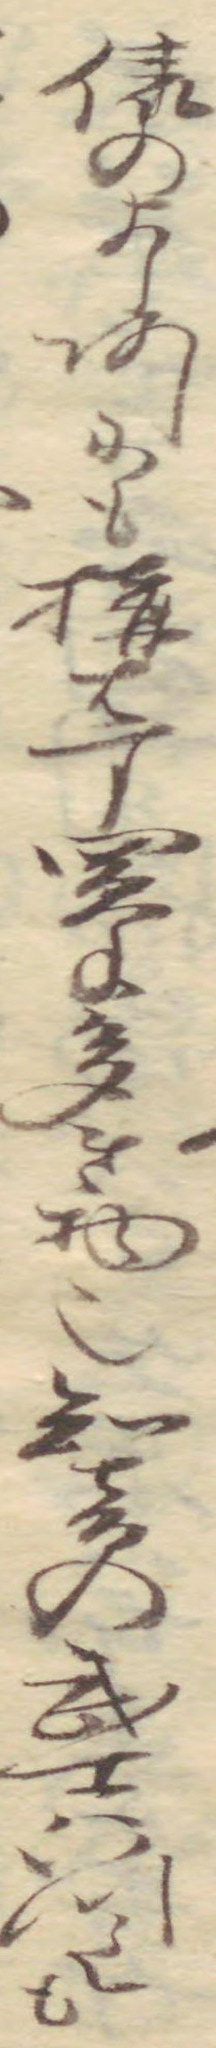俵のよしあしにも構はす買手多き物也知音の武士はいつニても
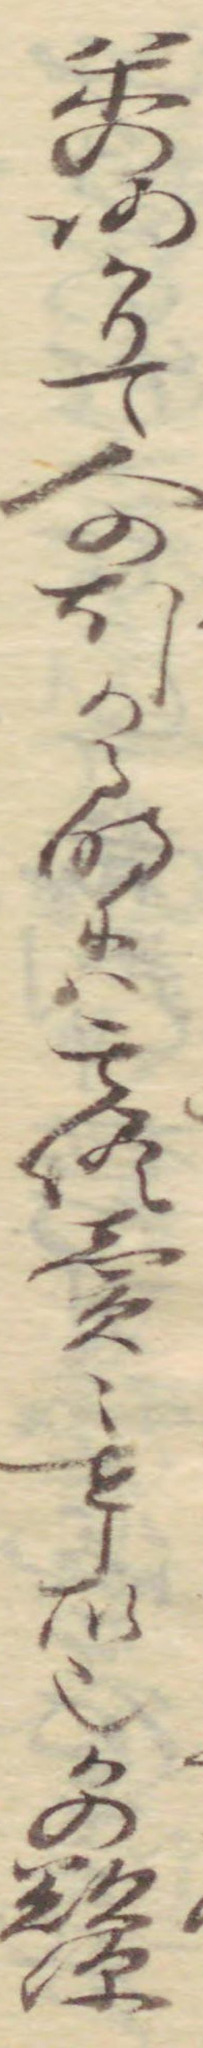米のあかりて人のほしかるときには其侭売〻せし故也かの欲深
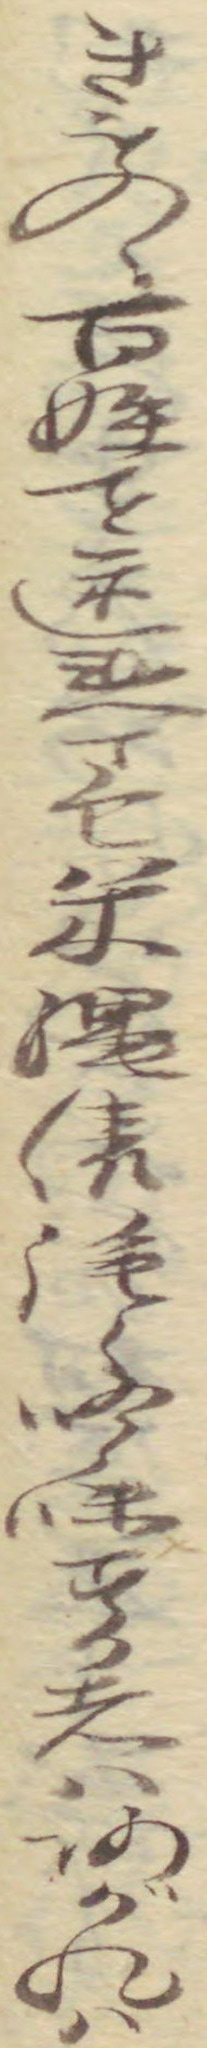きものゝ百姓を迷惑させ米縄俵強く吟味する者はあがれは
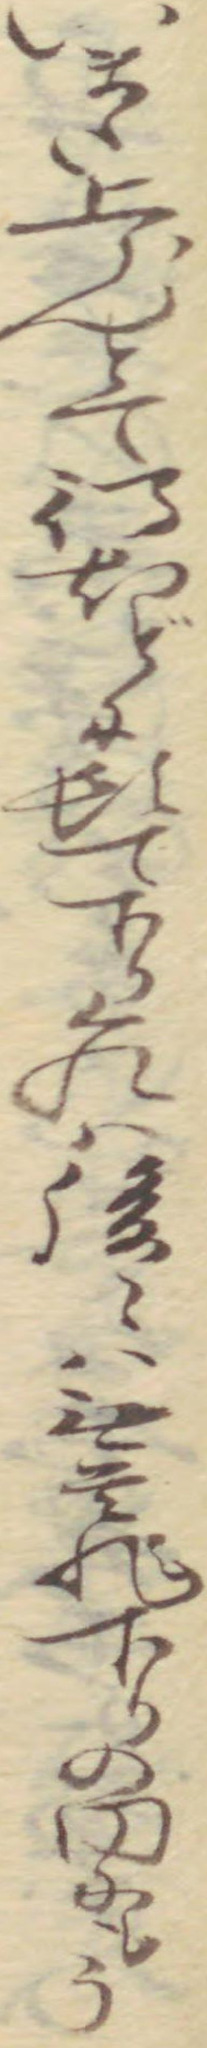いまた上らんとて待ほどに頓て下りくれは後〻は無是非下りの内にもう
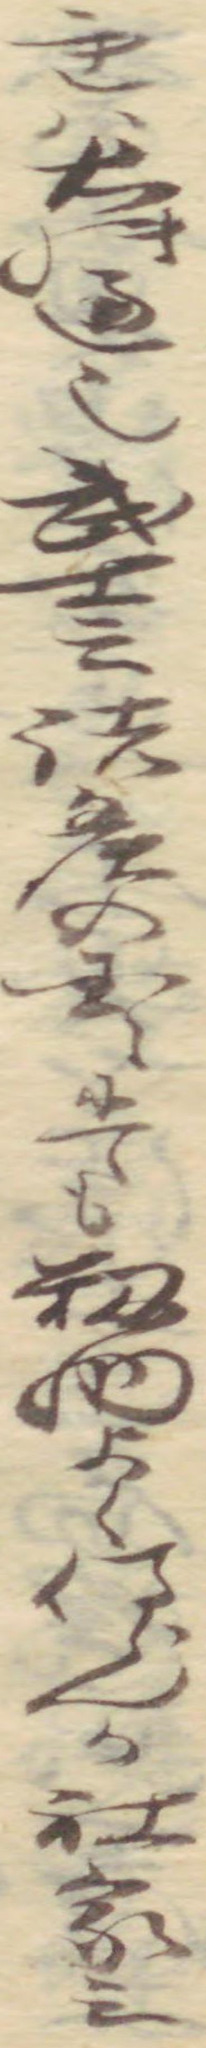れは右の通也武士云諸侯の国〻にても籾納よく侍らんか社家云
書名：鶯宿雑記. 巻263-264
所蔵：国立国会図書館 National Diet Library, JAPAN
